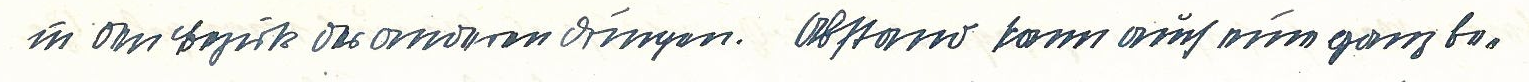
in den Bezirk des anderen dringen. Abstand kann auch eine ganz be¬
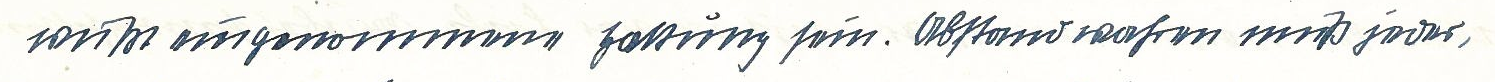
wußt eingenommene Haltung sein. Abstand wahren muß jeder,
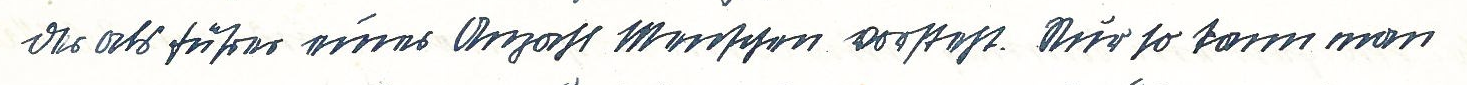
der als Führer einer Anzahl Menschen vorsteht. Nur so kann man
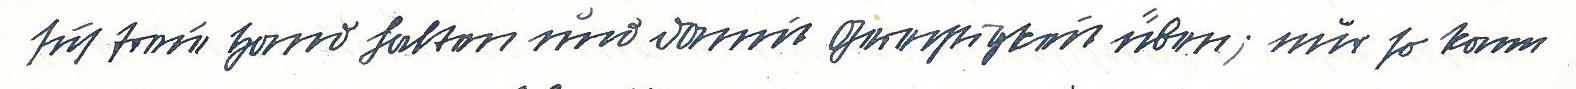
sich freie Hand halten und damit Gerechtigkeit üben; nur so kann
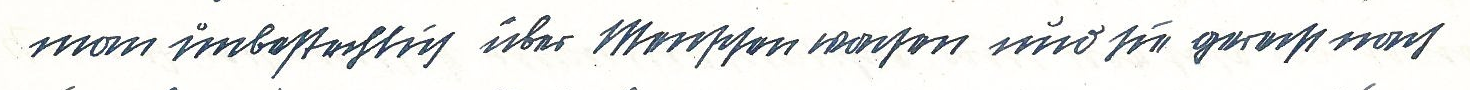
man unbestechlich über Menschen wachen und sie gerecht nach
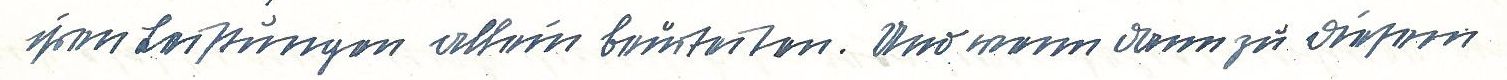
ihren Leistungen allein beurteilen. Und wenn dann zu diesem
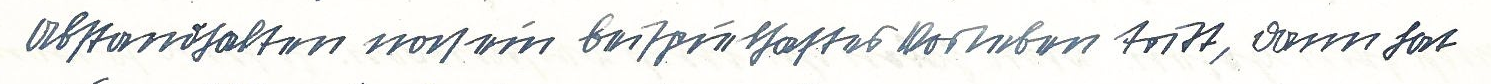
Abstandhalten noch ein beispielhaftes Vorleben tritt, dann hat
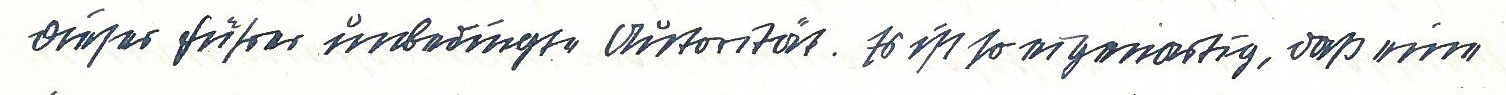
dieser Führer unbedingte Autorität. Es ist so eigenartig, daß eine
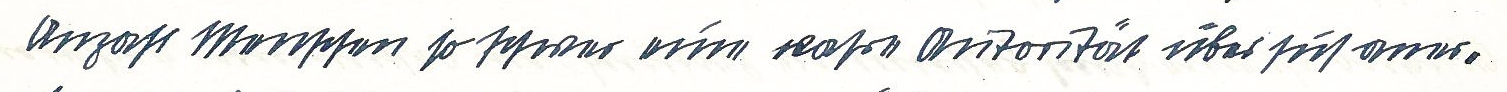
Anzahl Menschen so schwer eine wahre Autorität über sich aner¬
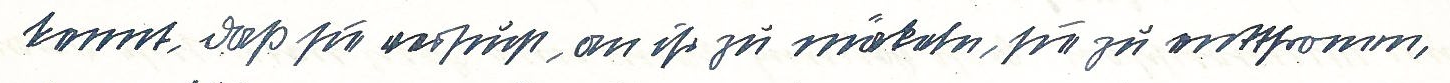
kennt, daß sie versucht, an ihr zu mäkeln, sie zu entthronen,
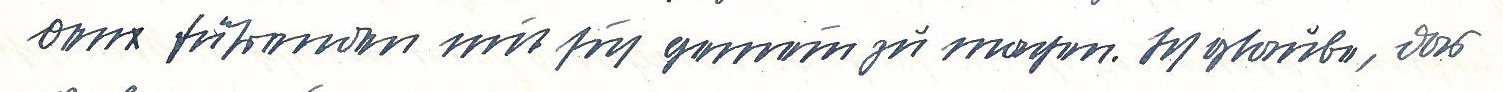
demn Führenden mit sich gemein zu machen. Ich glaube, das
